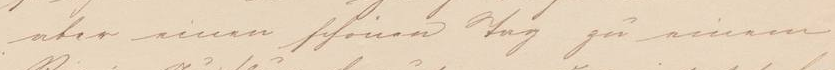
aber einen schönen Tag zu einem
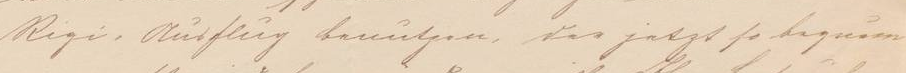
Rigi-Ausflug benutzen, der jetzt so bequem
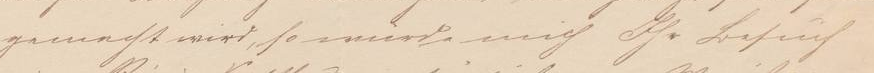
gemacht wird, so würde mich Ihr Besuch
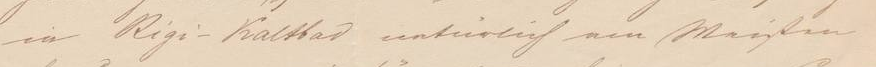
in Rigi-Kaltbad natürlich am Meisten
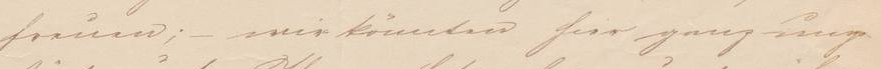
freuen; wir könnten hier ganz unge-
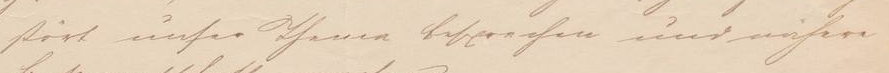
stört unser Thema besprechen und nähere
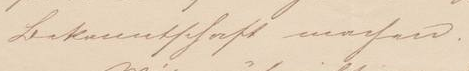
Bekanntschaft machen.
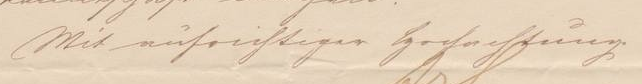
Mit aufrichtiger Hochachtung
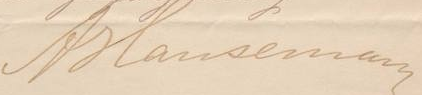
A Hansemann
